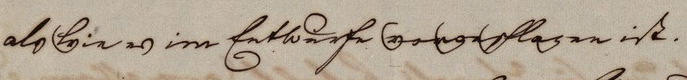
als wie es im Entwurfe vorgeschlagen ist.
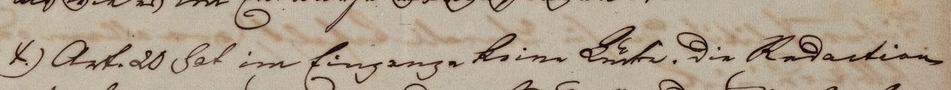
4.) Art. 20 hat im Eingange keine Lücke. Die Redaction
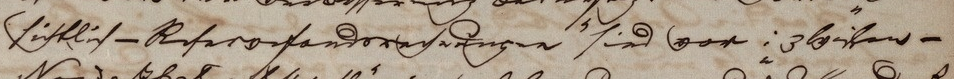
sichtlich – Reservefondsrechnungen» sind vor: «zwischen –
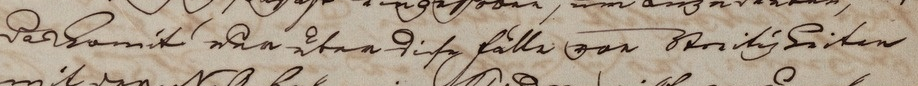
das Komité nur über diese Fälle von Streitigkeiten
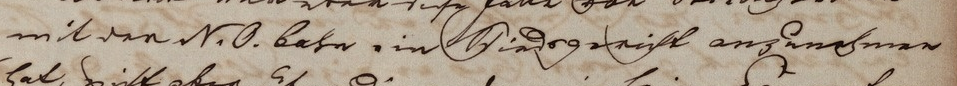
mit der N.O.bahn ein Schiedsgericht anzunehmen
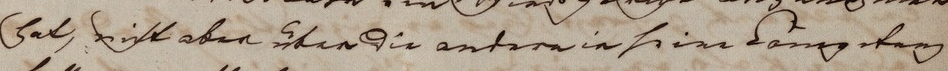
hat, nicht aber über die andern in seine Competenz
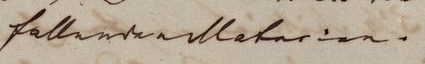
fallenden Materien.
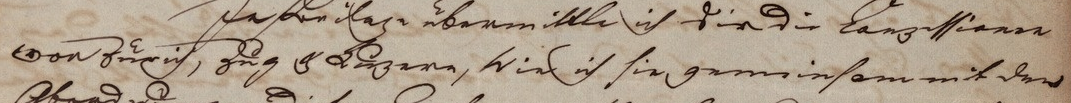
von Zürich, Zug & Luzern, wie ich sie gemeinsam mit den
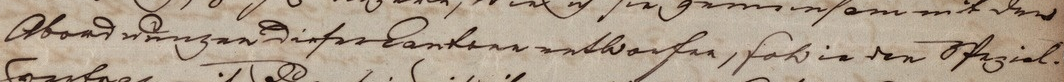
Abordnungen dieser Cantone entworfen, sowie den Spezial-
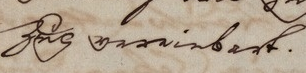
Zug vereinbart.
